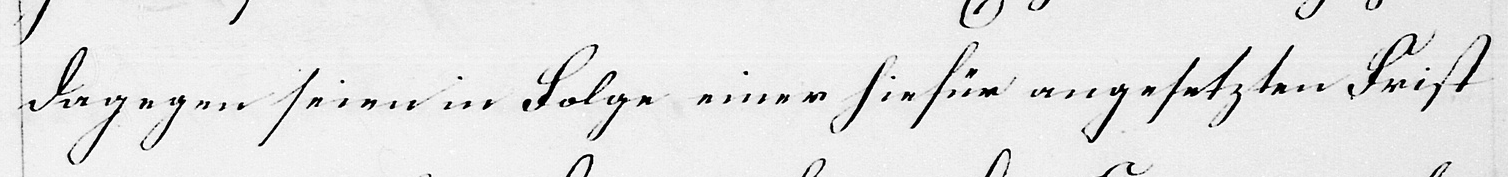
dagegen seien in Folge einer hiefür angesetzten Frist
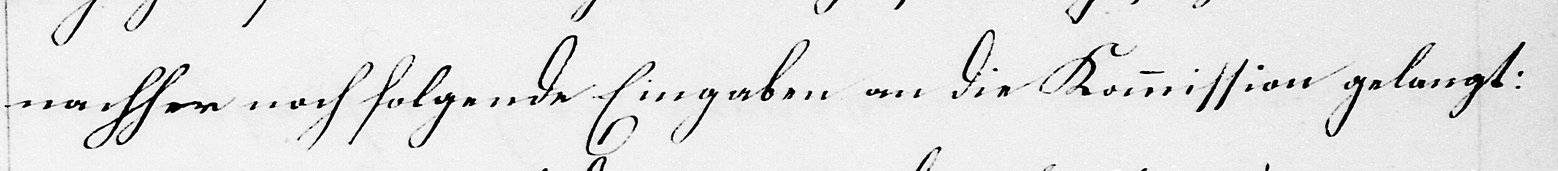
nachher noch folgende Eingaben an die Kommission gelangt:
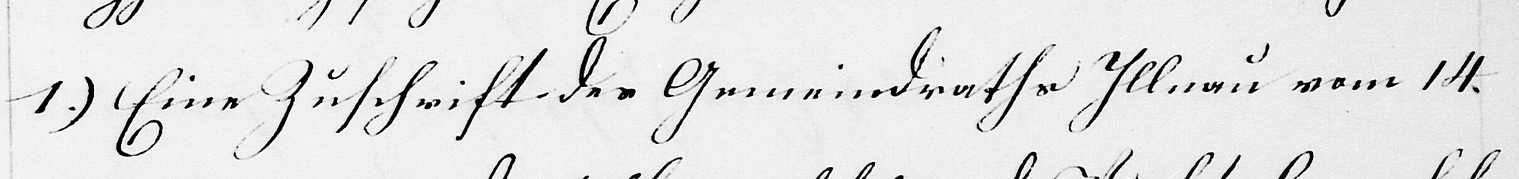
1.) Eine Zuschrift des Gemeindraths Illnau vom 14.
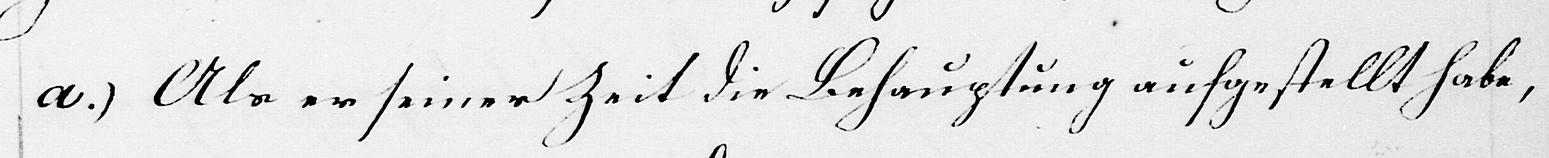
a.) Als er seiner Zeit die Behauptung aufgestellt habe,
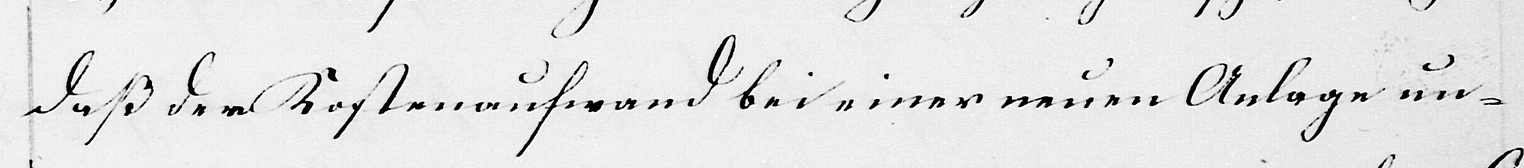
daß der Kostenaufwand bei einer neuen Anlage un¬
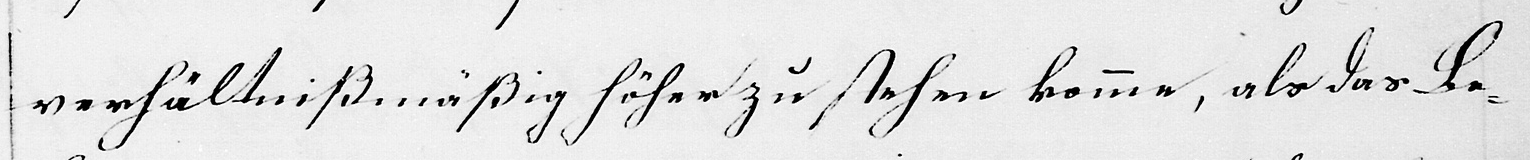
verhältnißmäßig höher zu stehen komme, als das Be¬
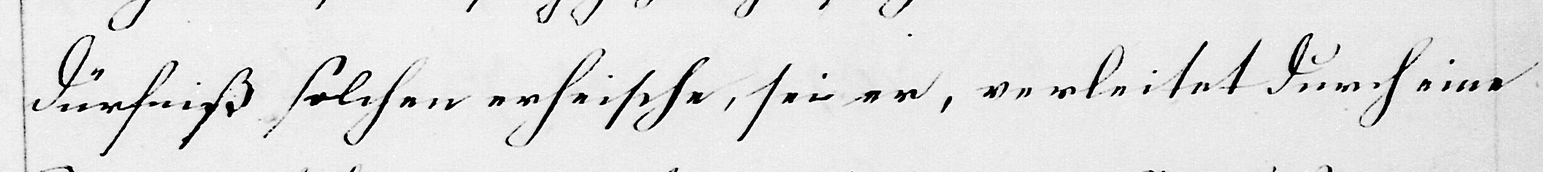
dürfniß solchen erheische, sei er, verleitet durch eine
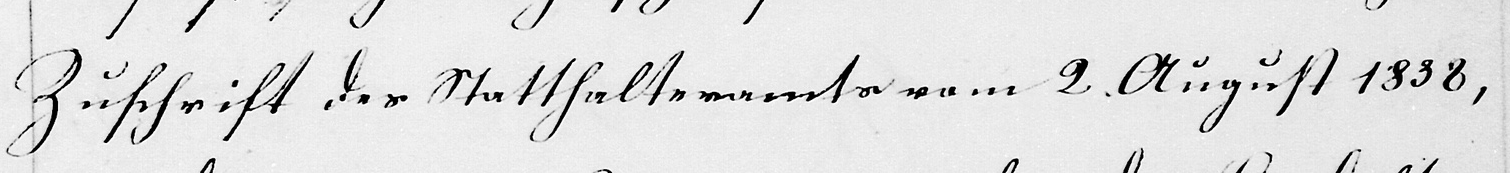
Zuschrift des Statthalteramts vom 2. August 1838,
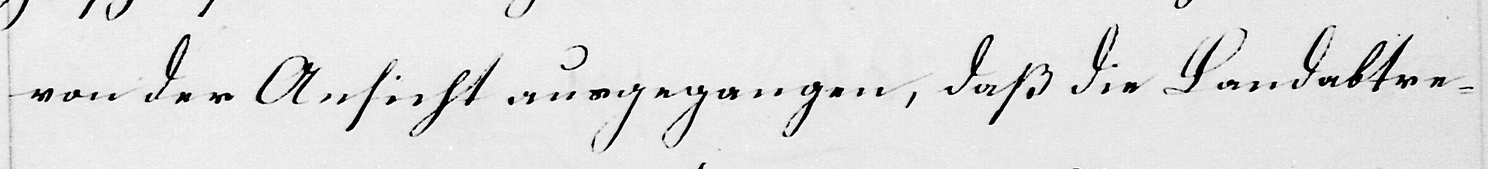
von der Ansicht ausgegangen, daß die Landabtre¬
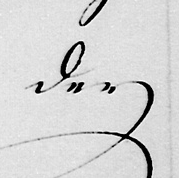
age.
